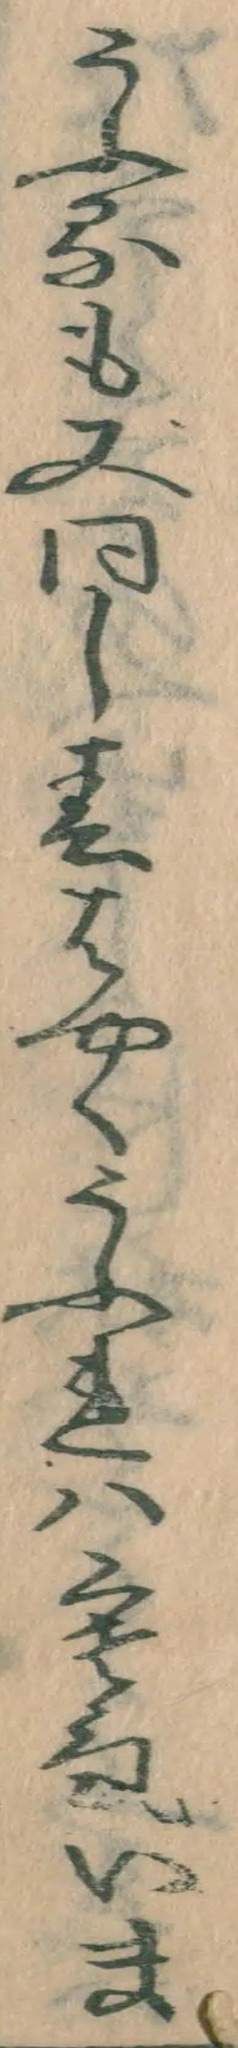うふるも又同し春はやくうふれは寒気いま

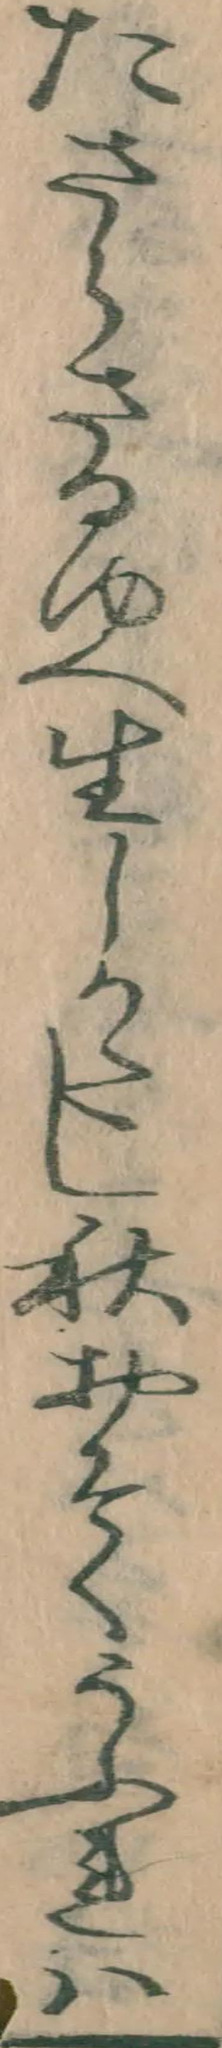たさらさるゆへ生しかたし秋おそくうふれは
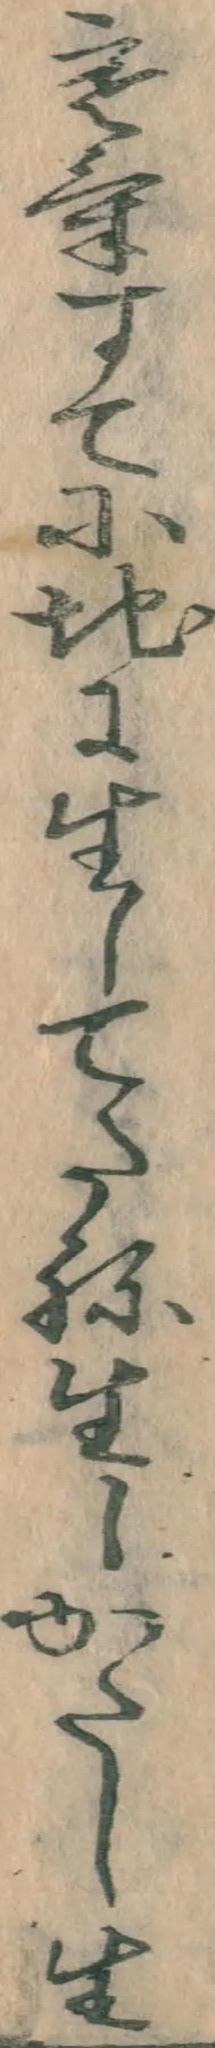寒気すてに地に生してたね生しかたし生
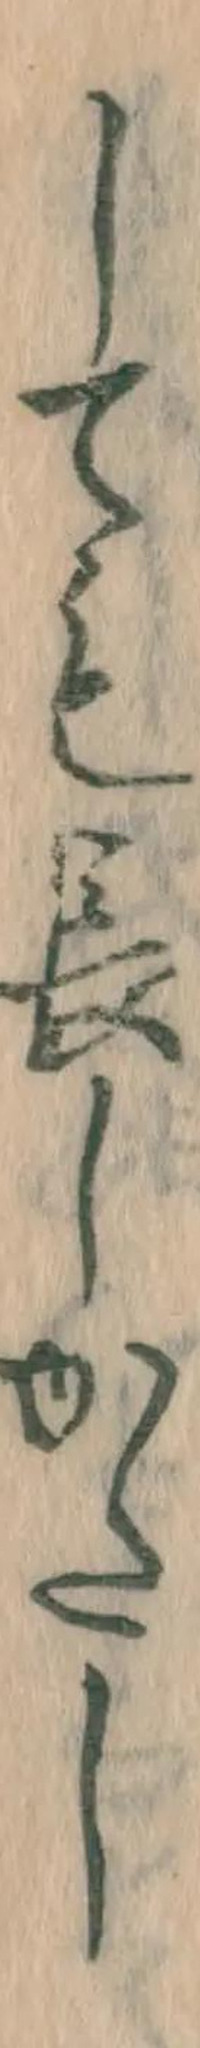しても長しかたし
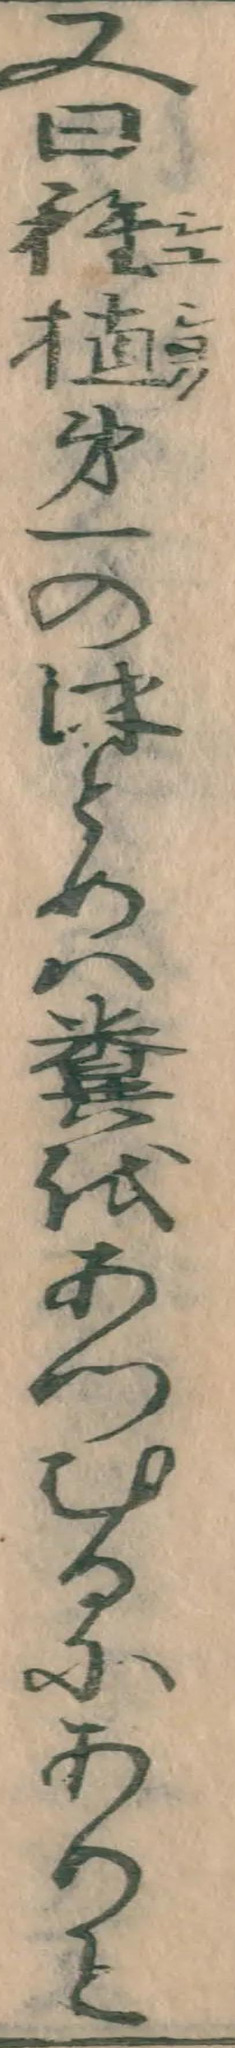又日種植第一のつとめは糞をあつむるにありと
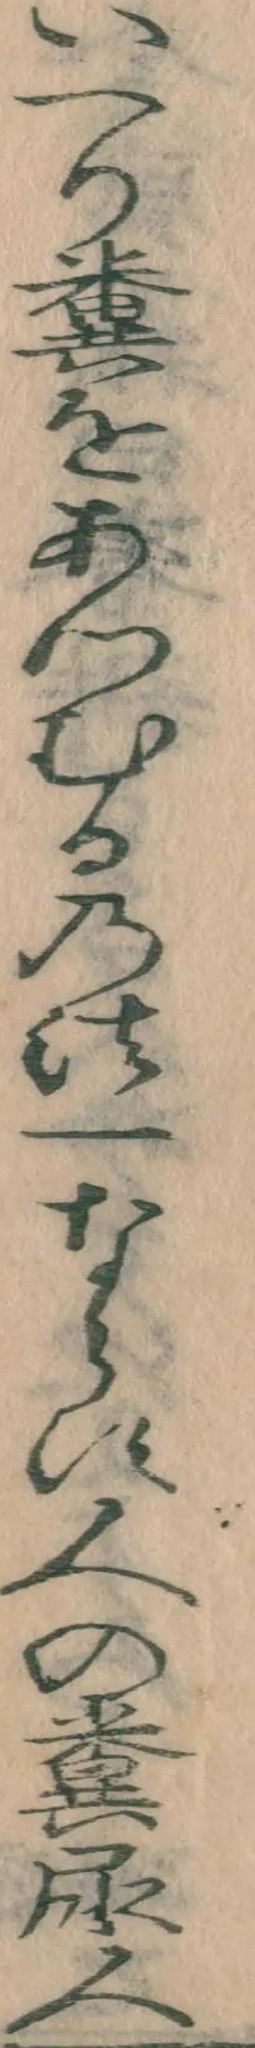いへり糞をあつむるの法一ならす人の糞尿人
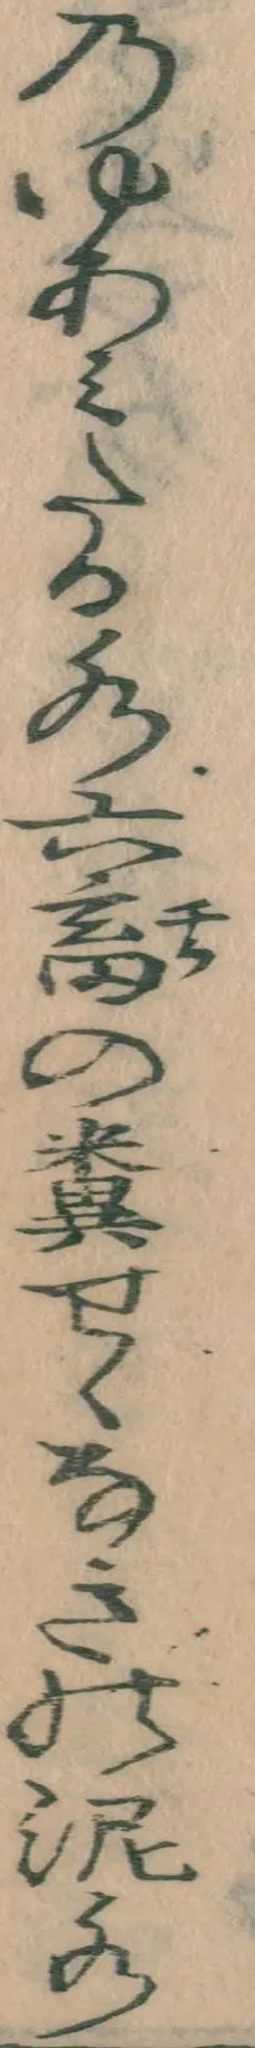のゆあみたる水六畜の糞せゝなきの泥水
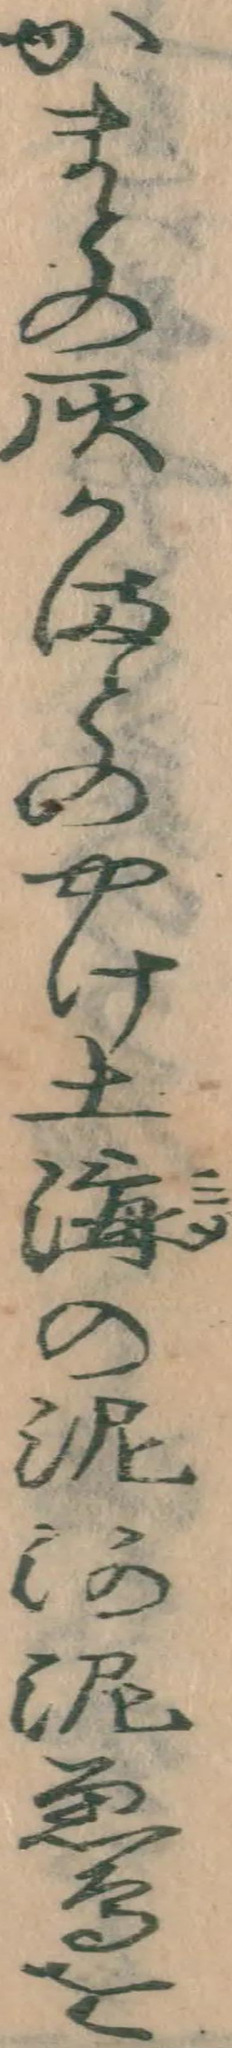かまとの灰かまとのやけ土溝の泥河泥魚鳥を
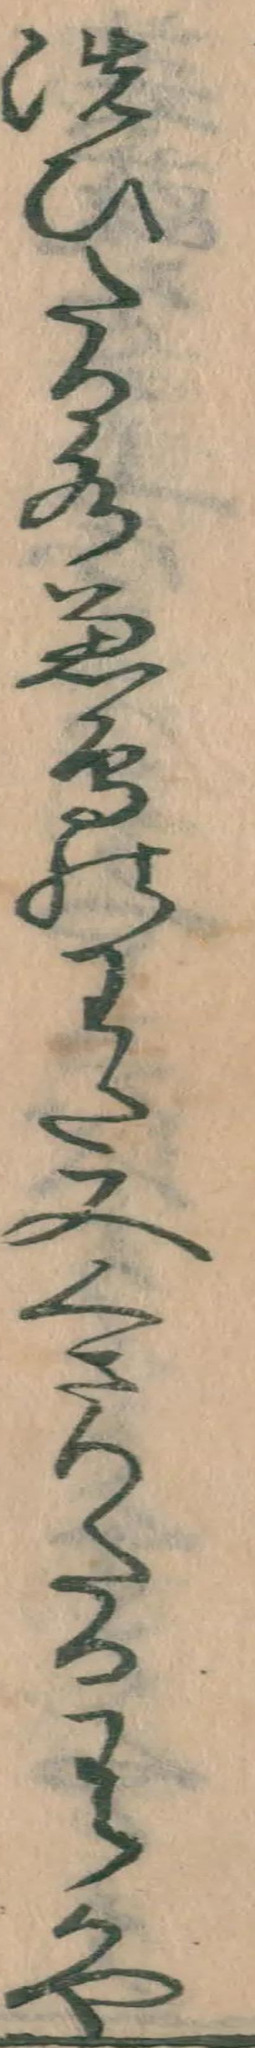洗ひたる水魚鳥のわた又くさりたるわらかや
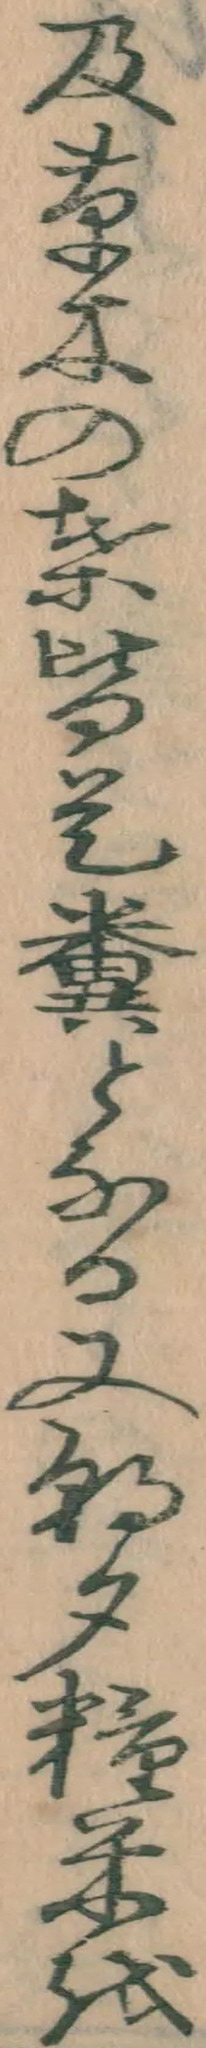及草木の葉皆是糞となる又朝夕糧米を
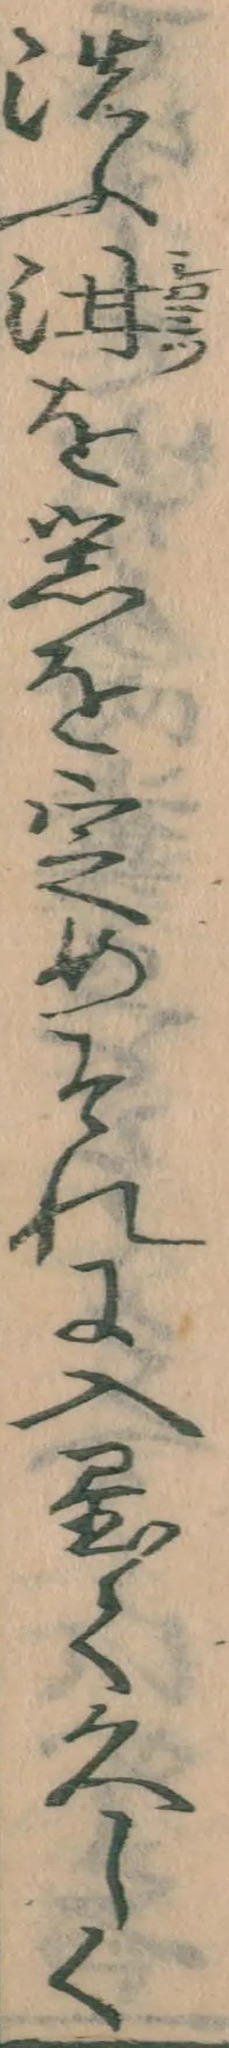洗ふ泔を器を定めそれに入置て久しく
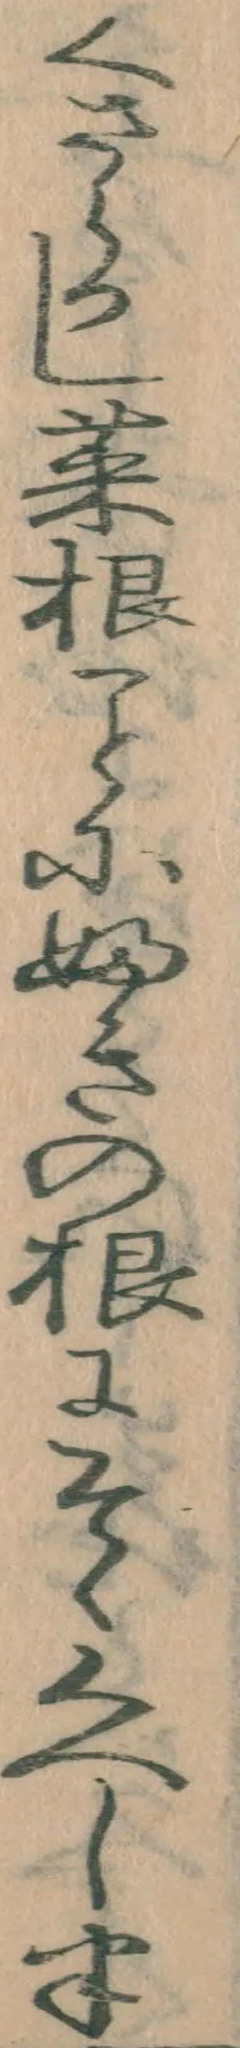くさらかし菜根ことにふきの根にそゝくへし半
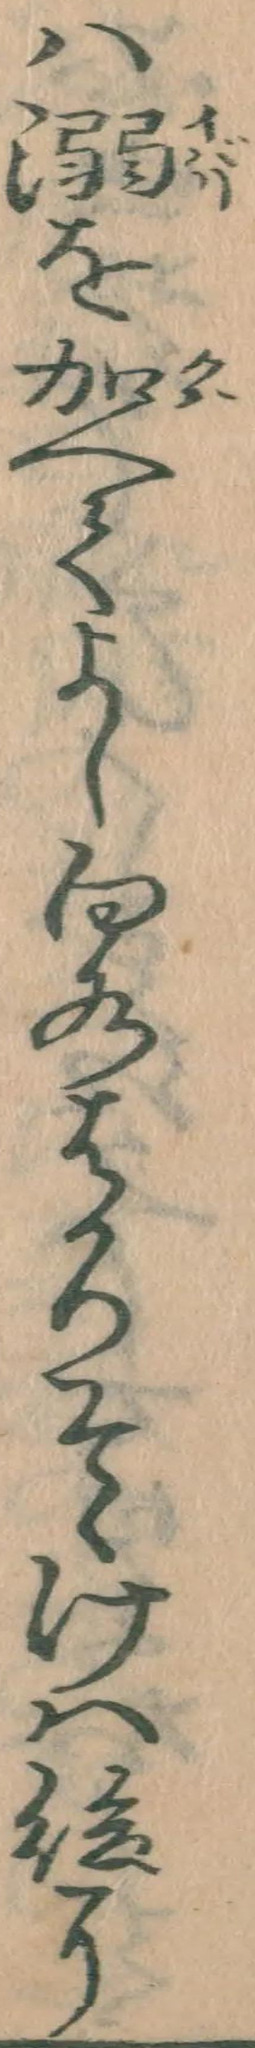は溺を加へてよし白水はかりそゝけは後に
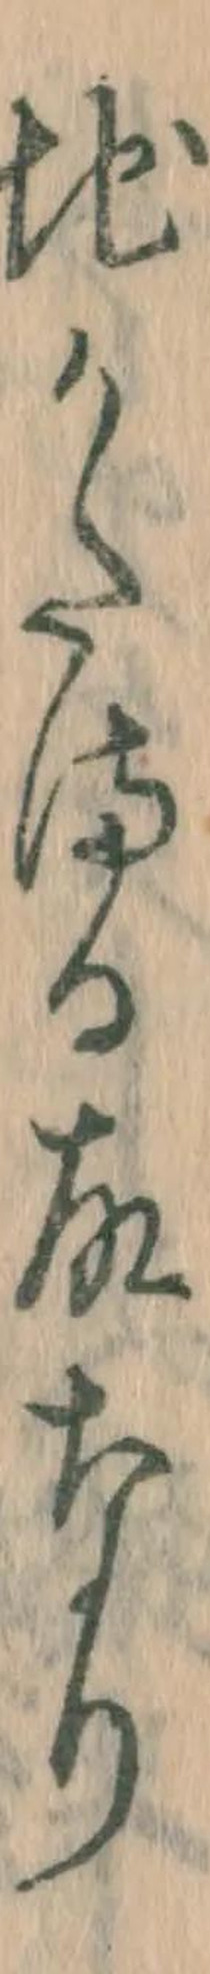地かたまる故なり
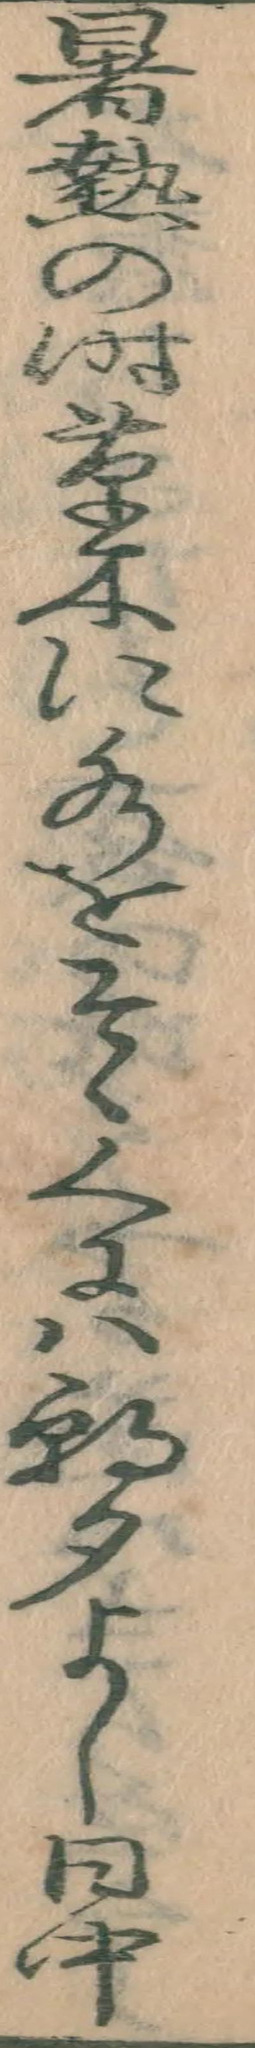暑熱の時草木に水をそゝくには朝夕よし日中
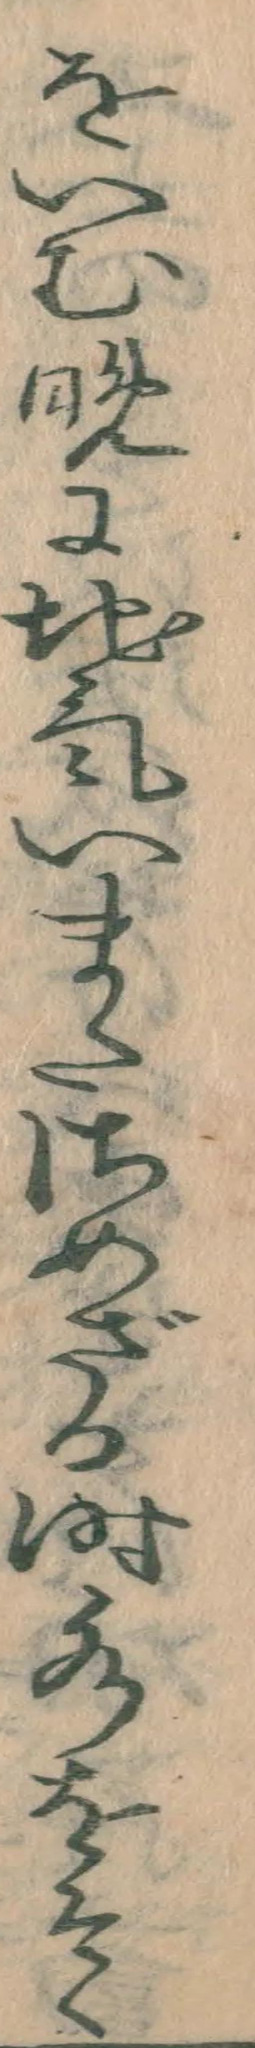をいむ晩に地気いまたさめざる時水をそゝ
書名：菜譜 3巻
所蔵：国立国会図書館 National Diet Library, JAPAN
